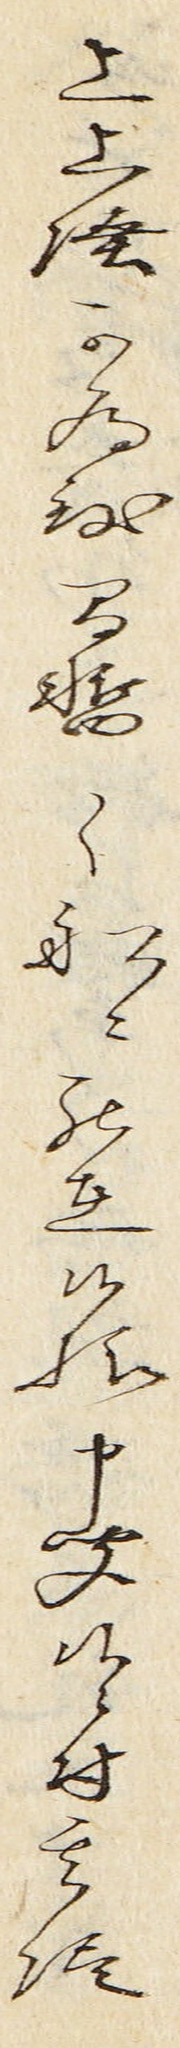上上陸可為致間暫く船に罷在候様申聞候に付其侭
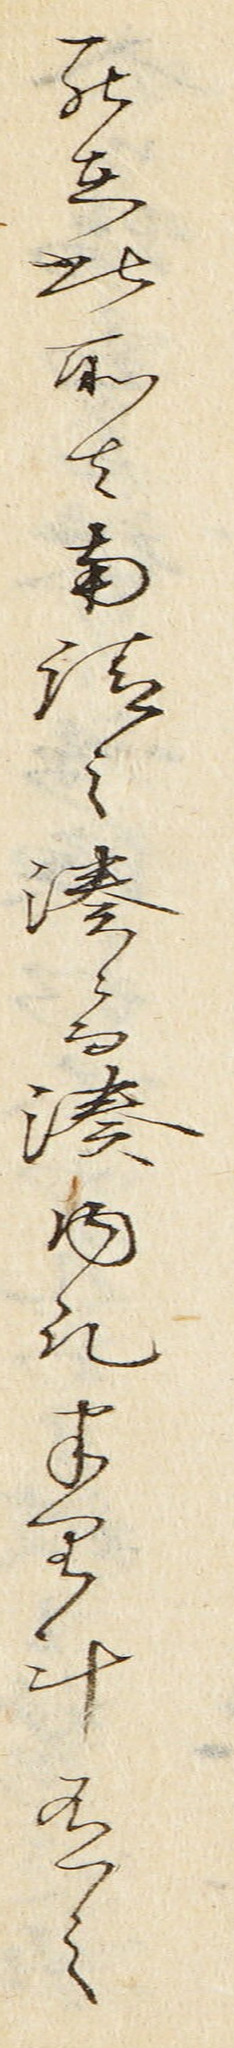罷在此所南請之湊に而湊内凡半里計有之

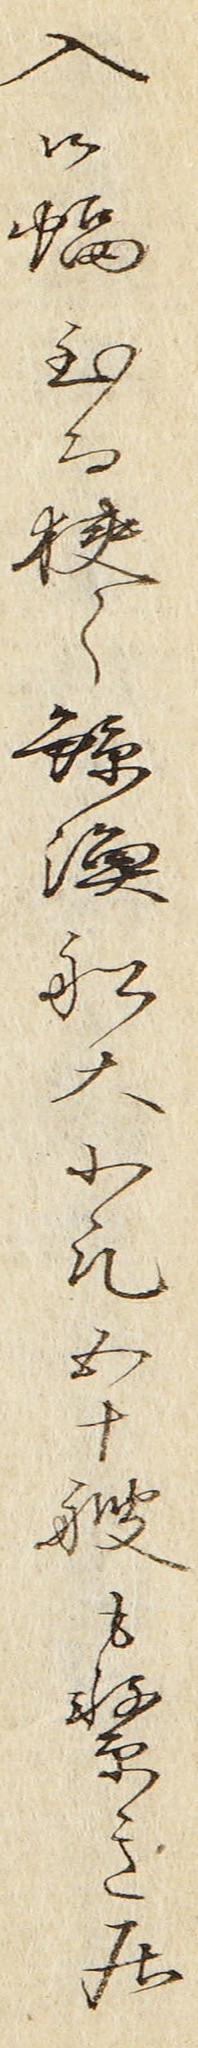入候幅至而狭く鯨漁船大小凡五十艘も繋き居
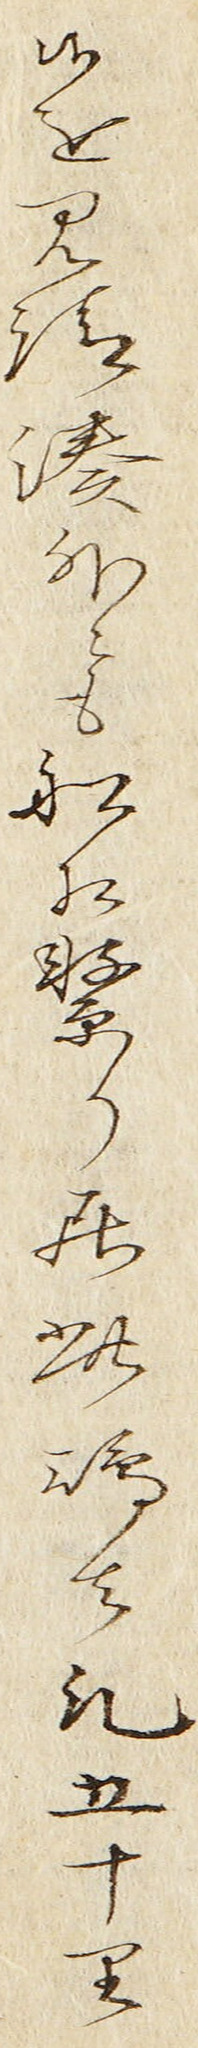候を見請湊外にも船相繋り居此嶋は凡五十里
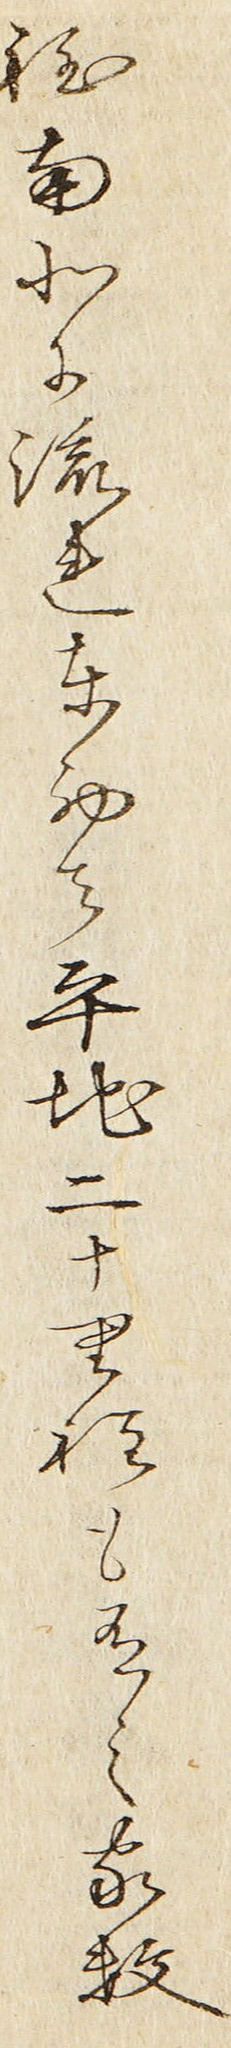程南北に流れ東西は平地二十里程も有之家数
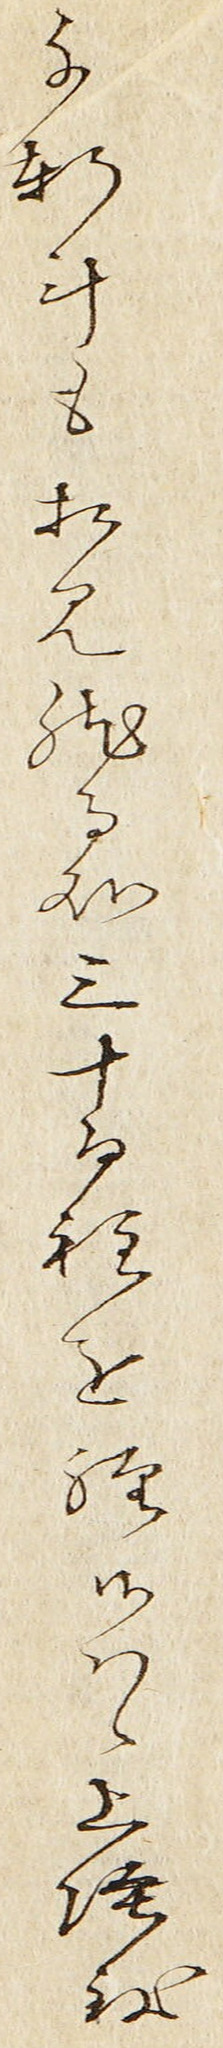千軒計も相見然る処三十日程を経候はゝ上陸致
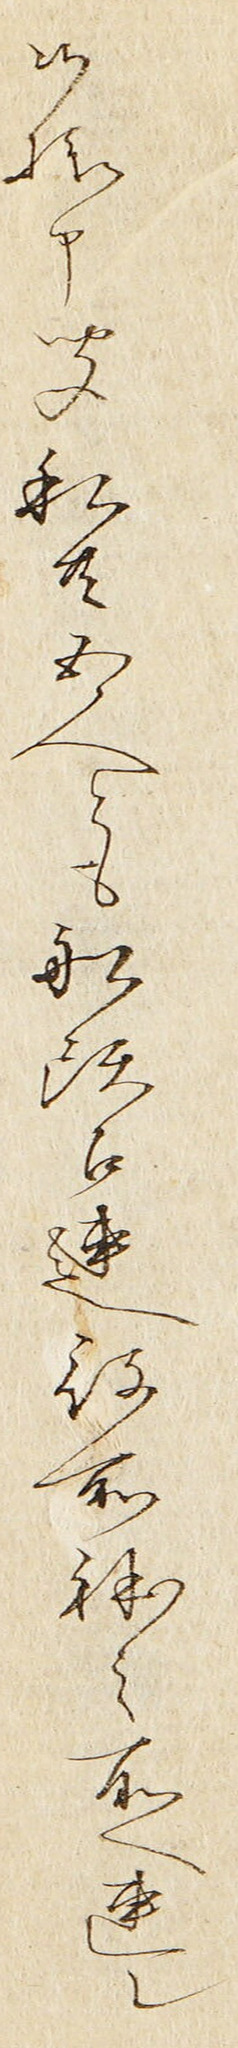候様申聞私共五人とも船頭召連役所躰之所へ連れ
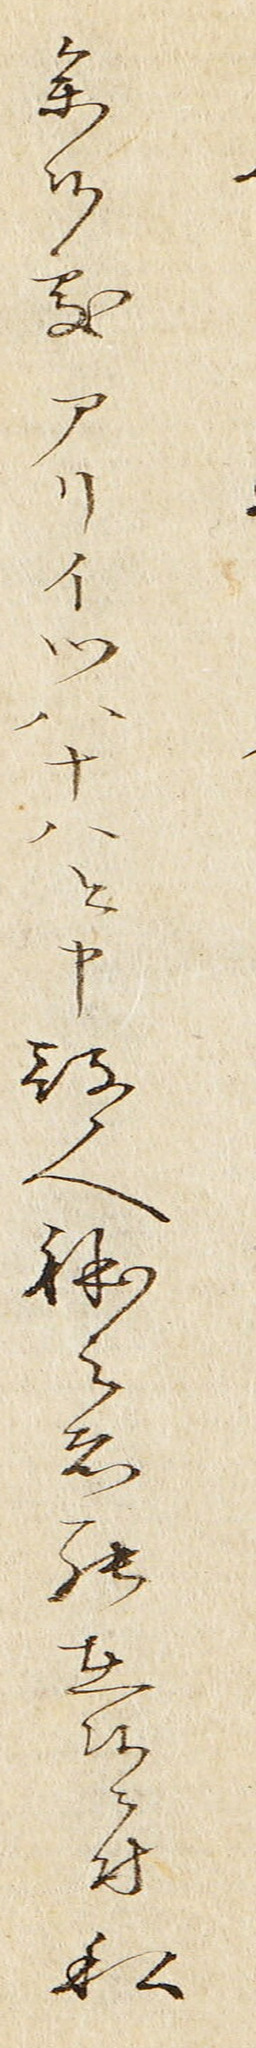参候処アリイツハナハと申役人躰之者罷在候に付私
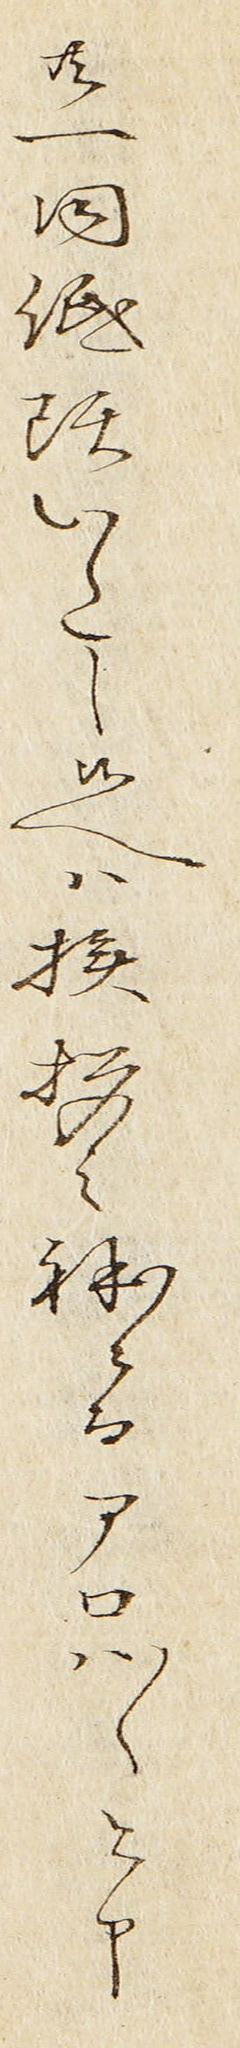共一同低頭いたし候へは挨拶之躰に而アロハ〳〵と申
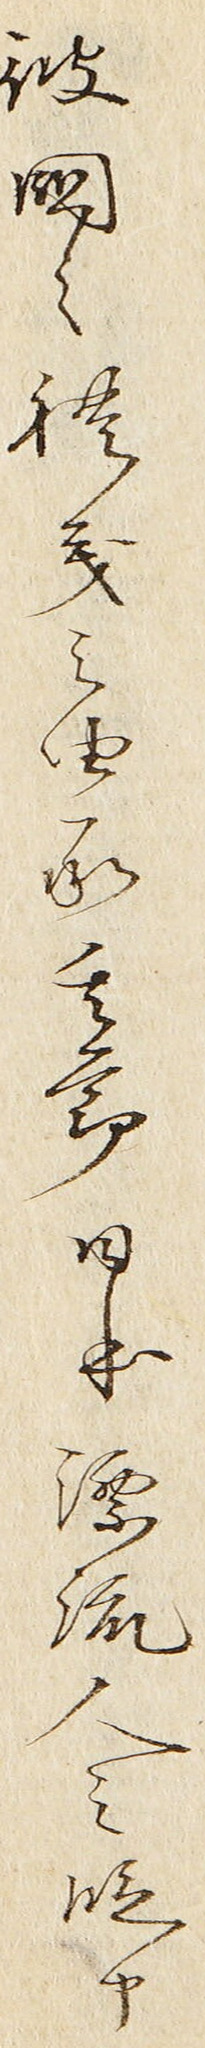彼国之礼儀之由承其節日本漂流人之段申
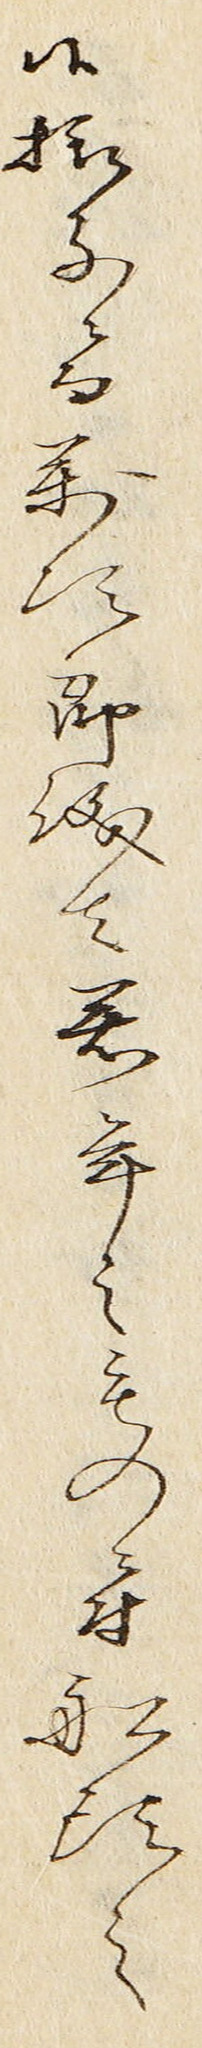候様子に而万次郎儀は若年之ものに付船頭之
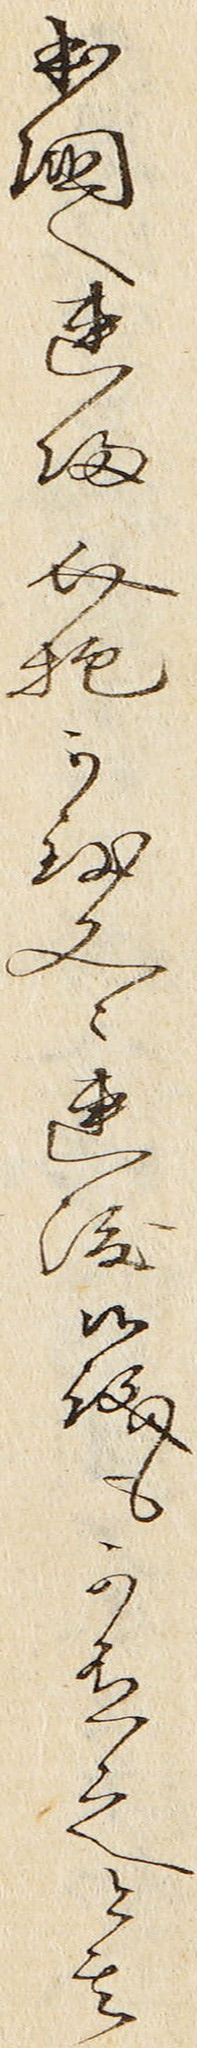本国へ連帰介抱可致又々連渡候儀も可有之と其
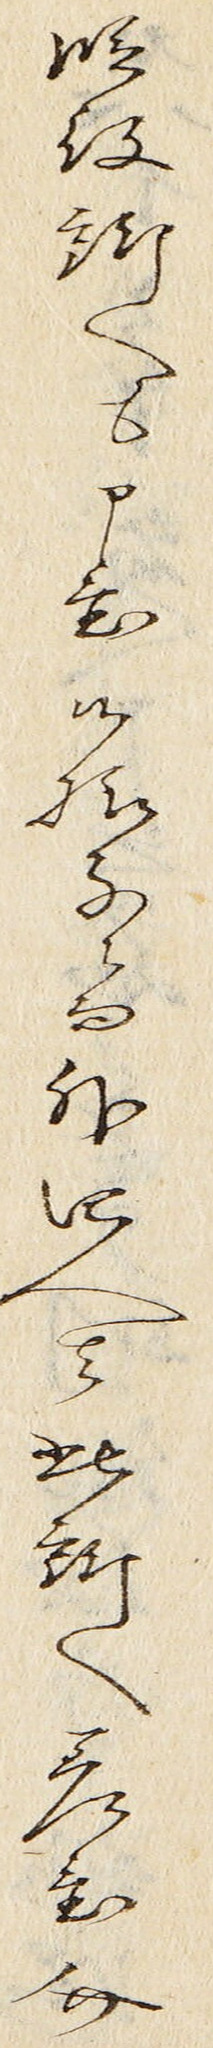段役所へも申置候様子に而他四人は此所へ差置介
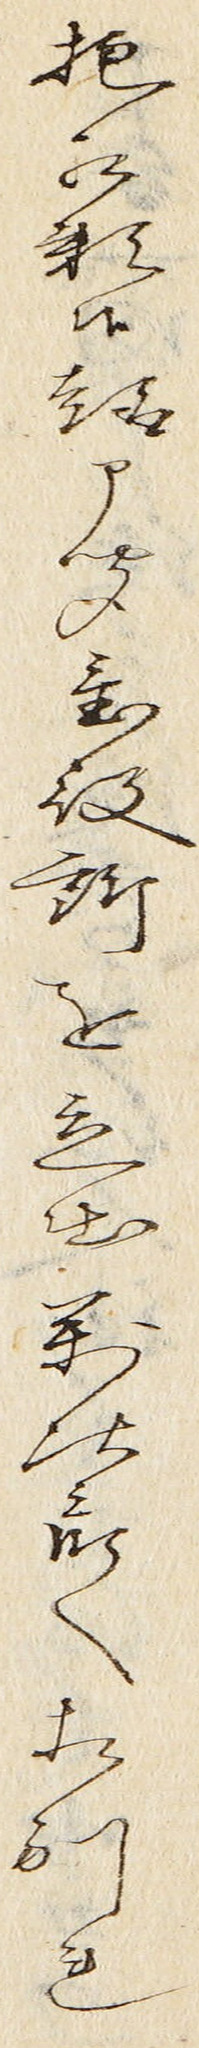抱相頼候趣申聞置役所を立出万次郎へ相別れ
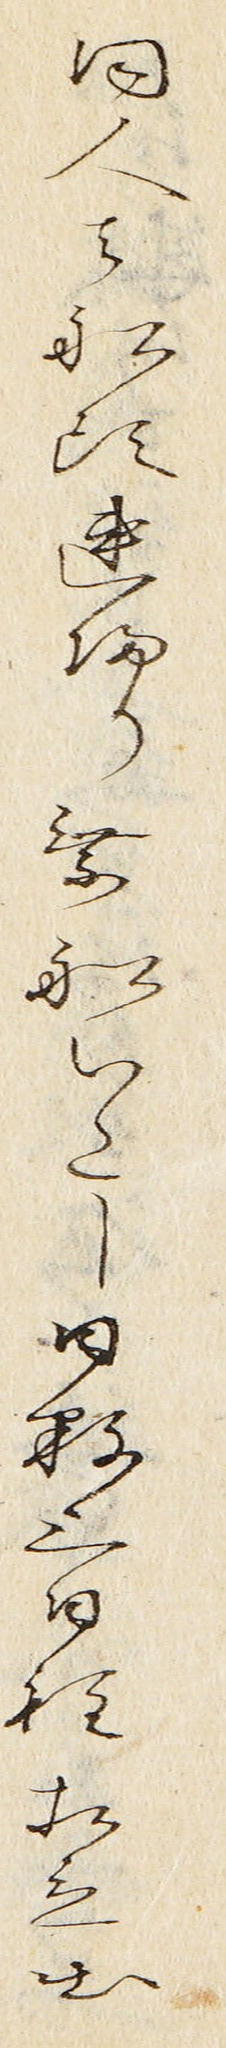同人は船頭連帰り乗船致し日数三日程相立出
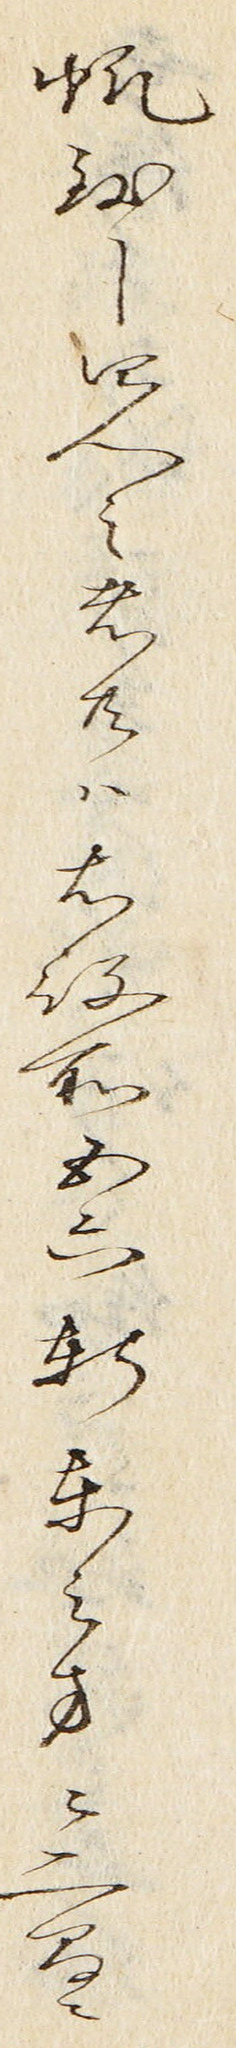帆致し四人の者共右役所五碌六軒東之方に二間に
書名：土佐中浜万次郎漂流記
